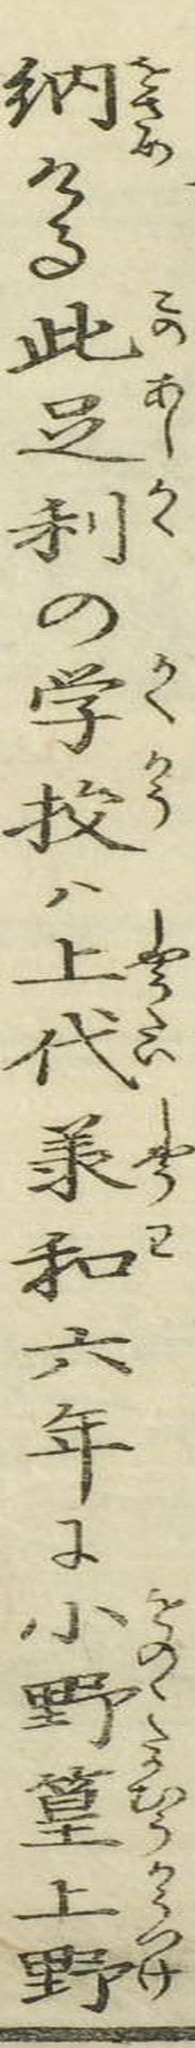納ける此足利の学校は上代承和六年に小野篁上野
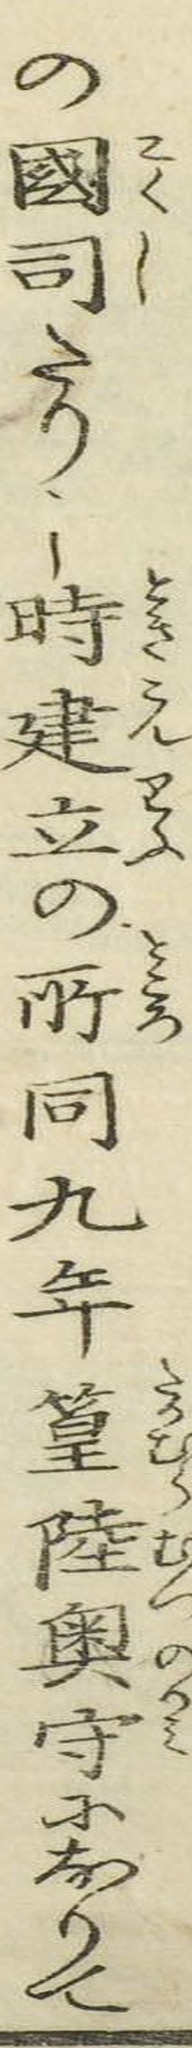の國司たりし時建立の所同九年篁陸奥守になりて
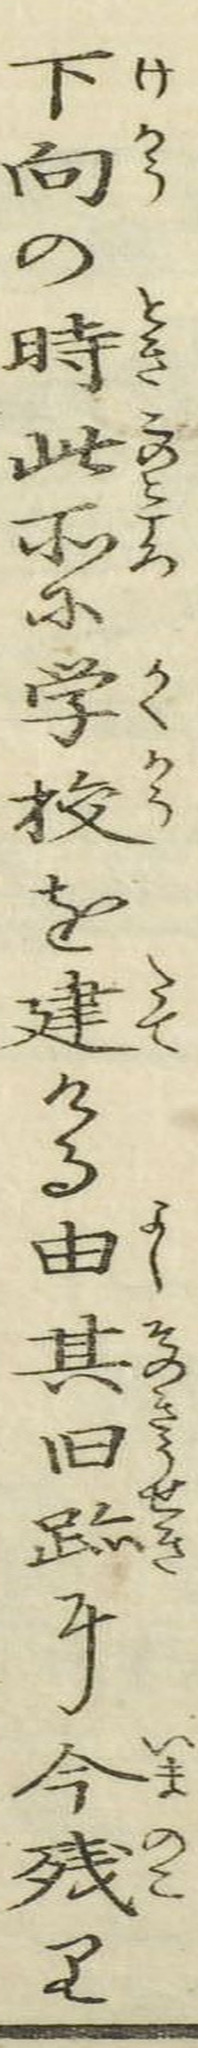下向の時此所に学校を建ける由其旧跡に今残り
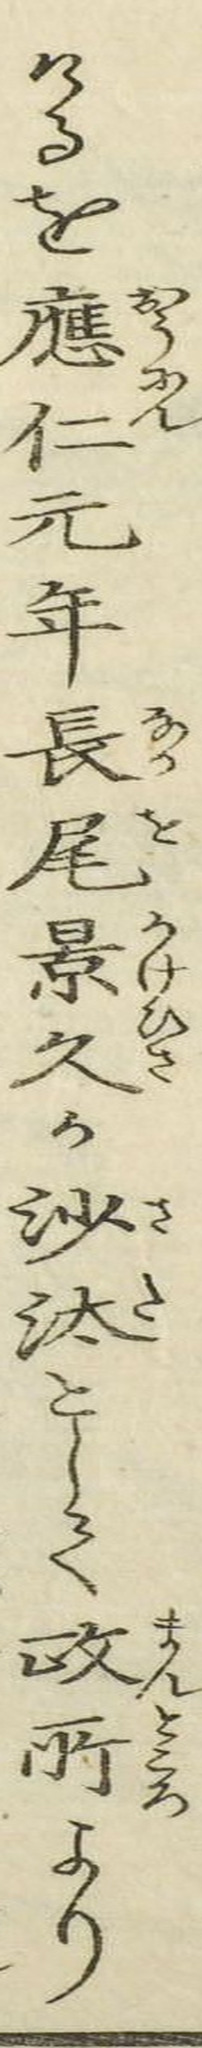けるを應仁元年長尾景久か沙汰として政所より
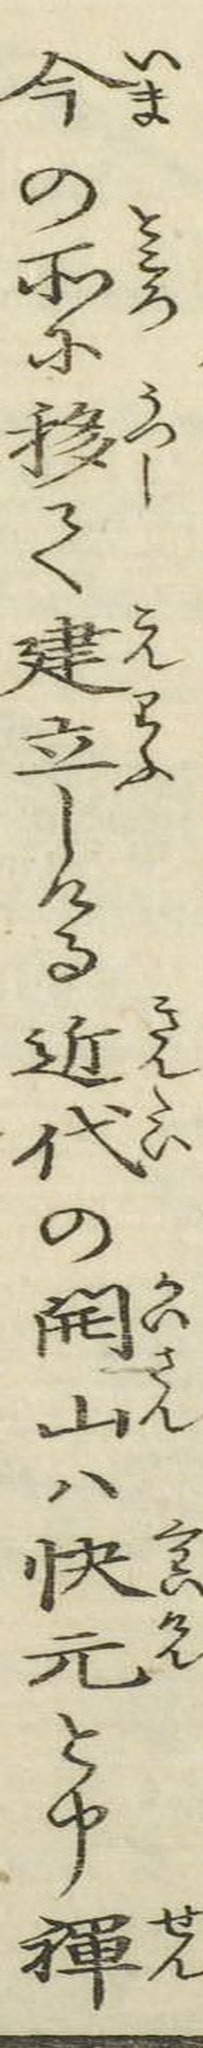今の所に移て建立しける近代の開山は快元と申禪
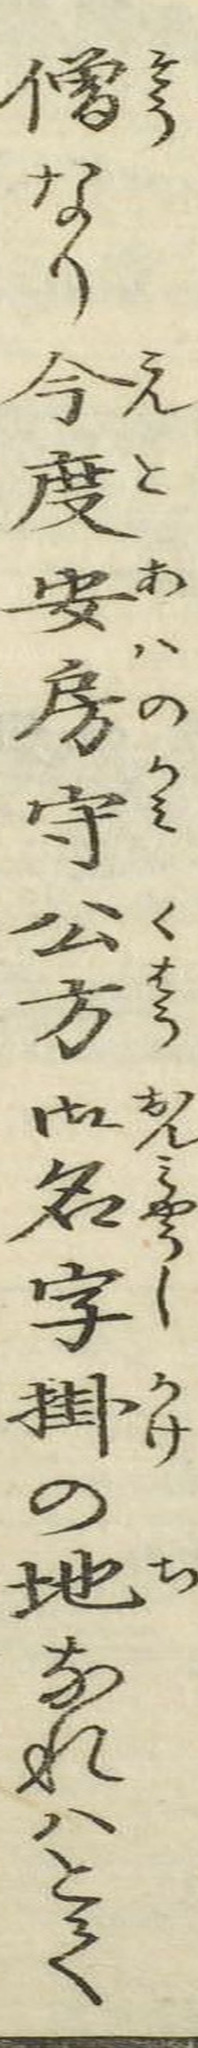僧なり今度安房守公方御名字掛の地なれはとて
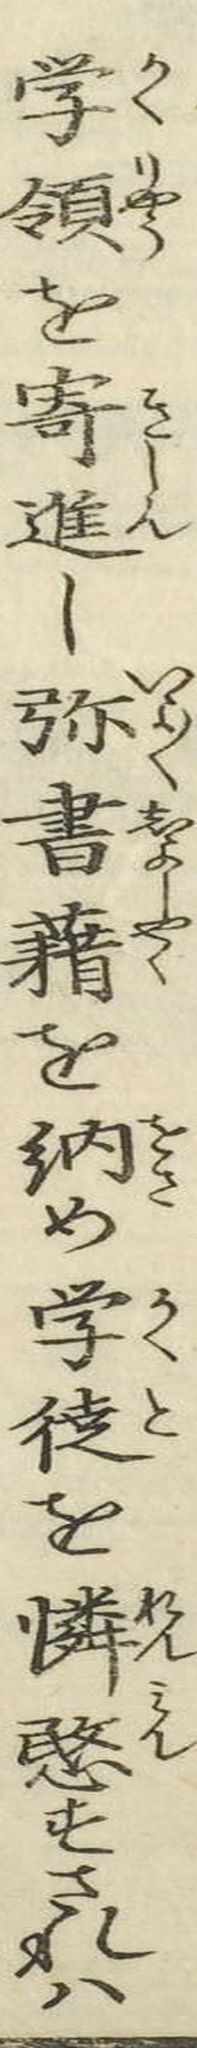学領を寄進し弥書藉を納め学徒を憐愍すされは
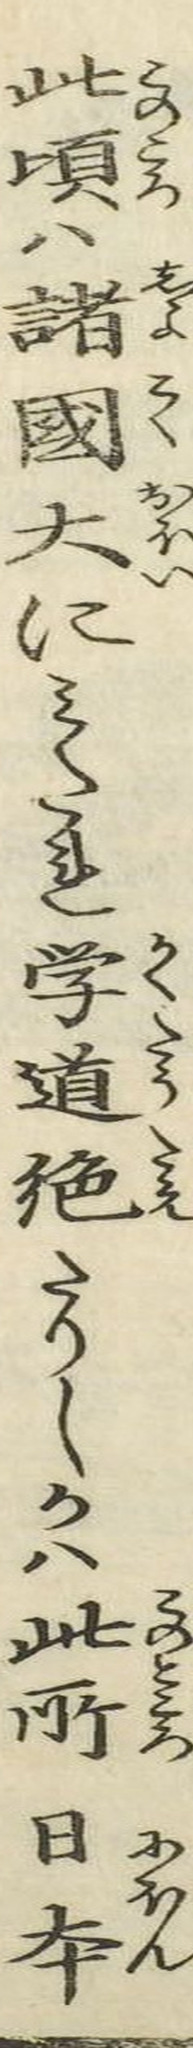此頃は諸國大にみたれ学道絶たりしかは此所日本
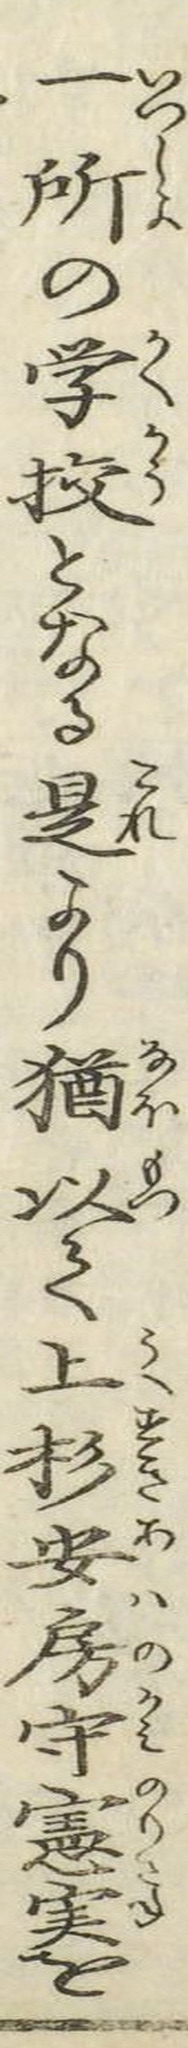一所の学校となる是より猶以て上杉安房守憲実を
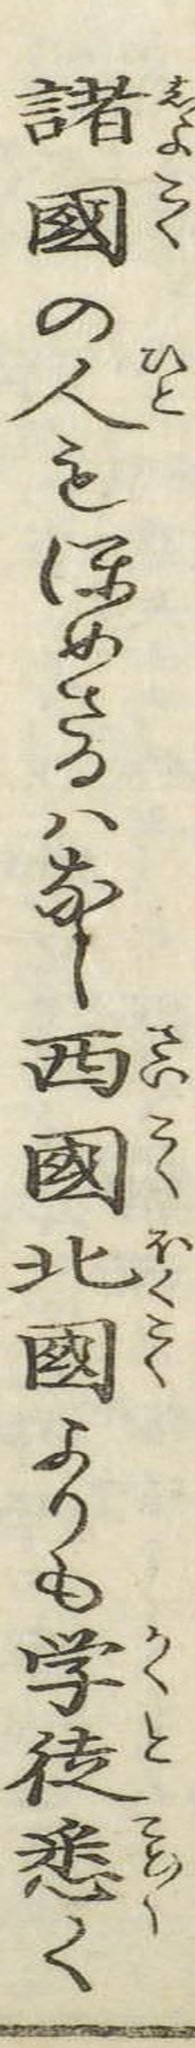諸國の人もほめたるはなし西國北國よりも学徒悉く
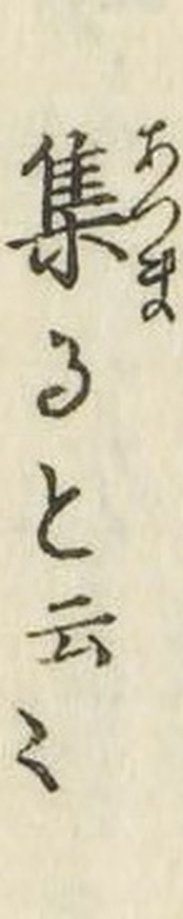集ると云々
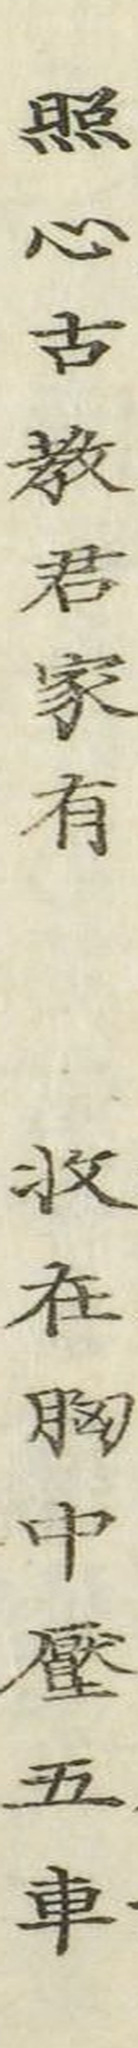照心古教君家有収在胸中壓五車
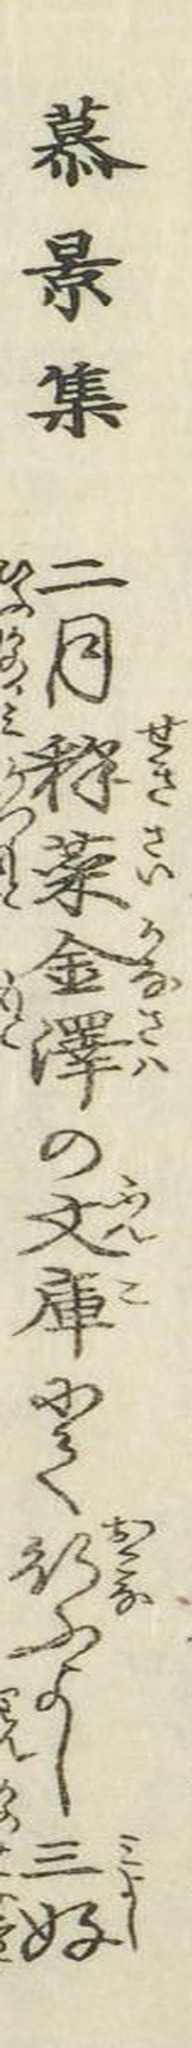慕景集二月釋菜金澤の文庫にて行ふよし三好
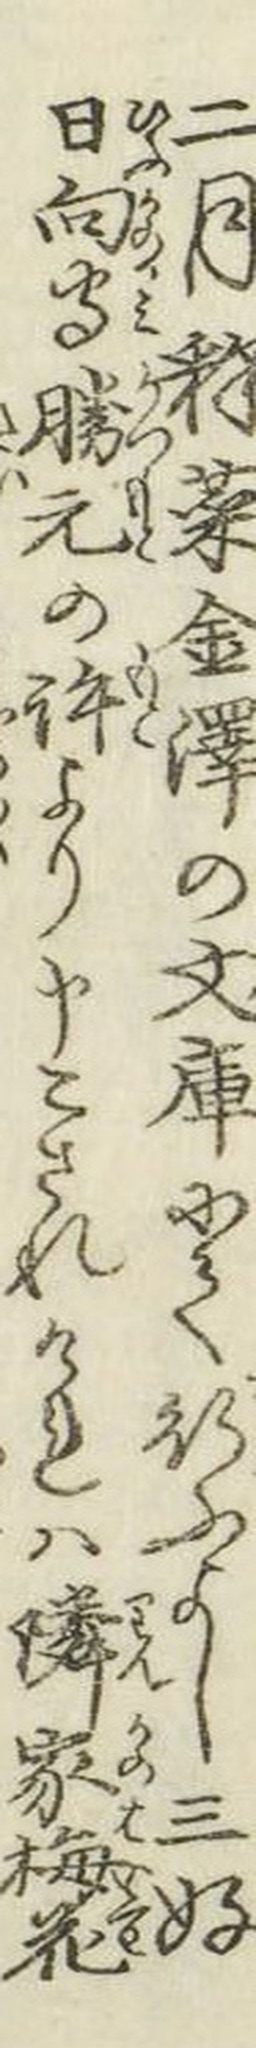日向守勝元の許より申こされけれは隣家梅花
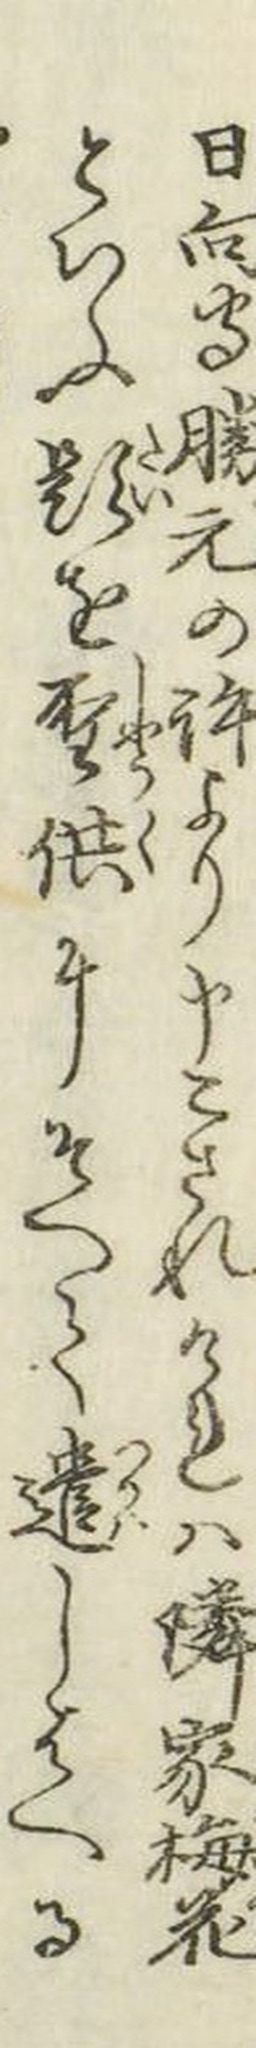といふ題を聖供にそへて遣しはへる
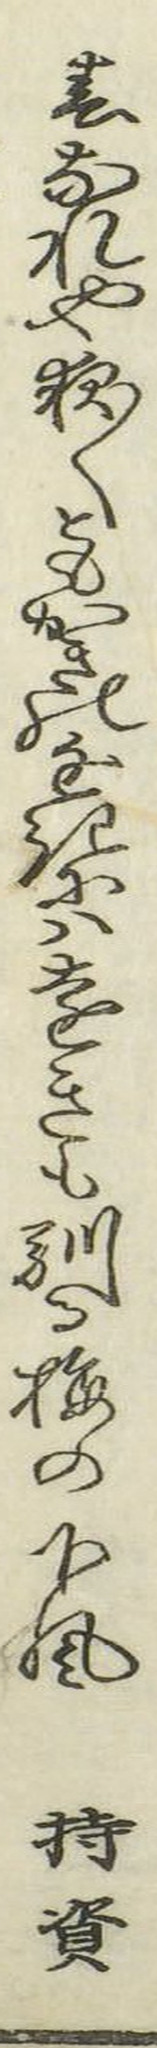春なれや夜〳〵ともかきのをきには遠きも馴る梅の下風持資
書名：江戸名所図会 20巻 巻之6
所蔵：東京学芸大学教育コンテンツアーカイブ
